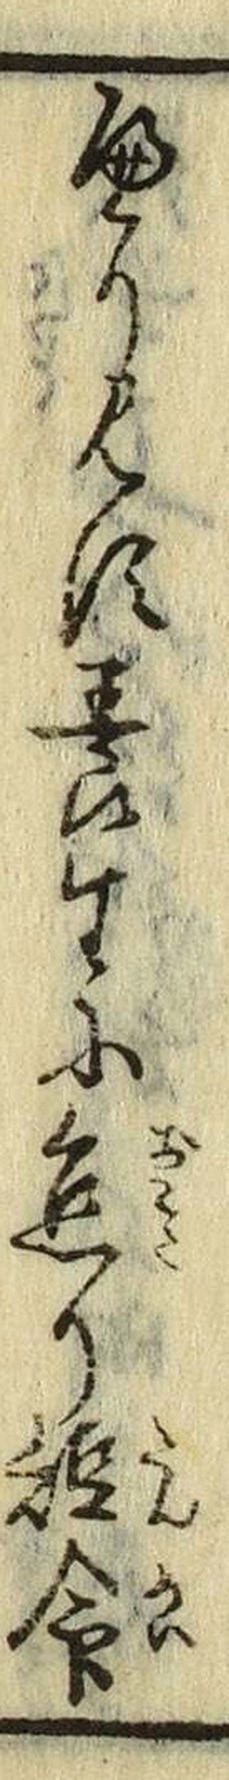へり見す養生に怠り短命
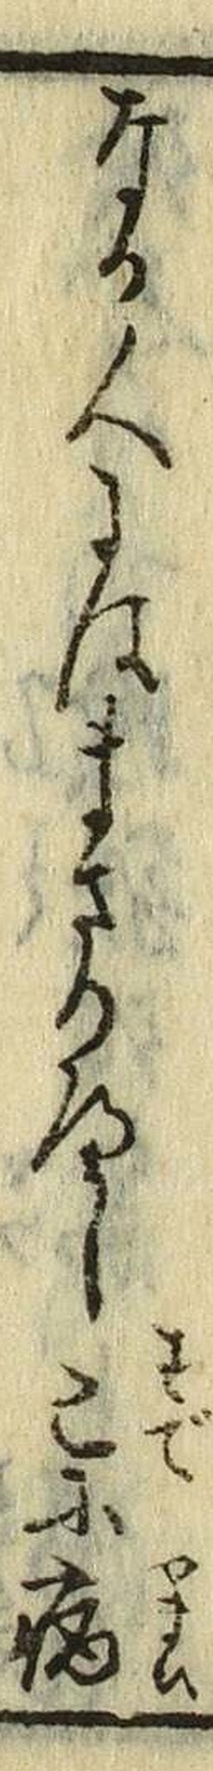なる人にはまさるへし已に病
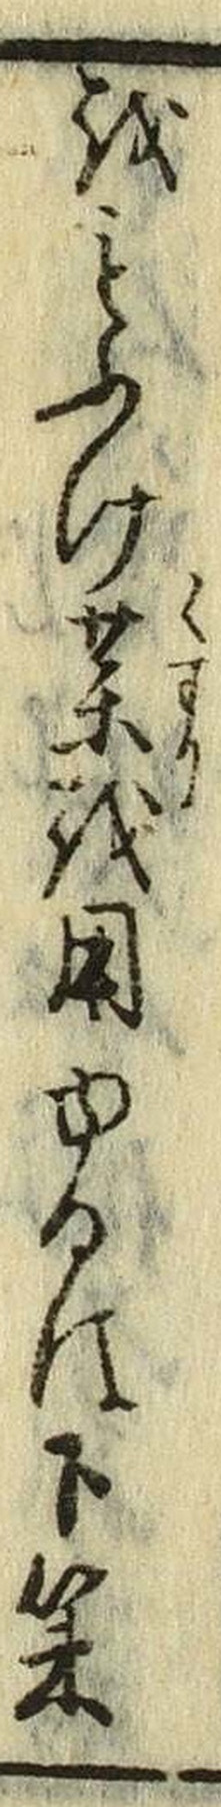をもふけ薬を用ゆるは下策
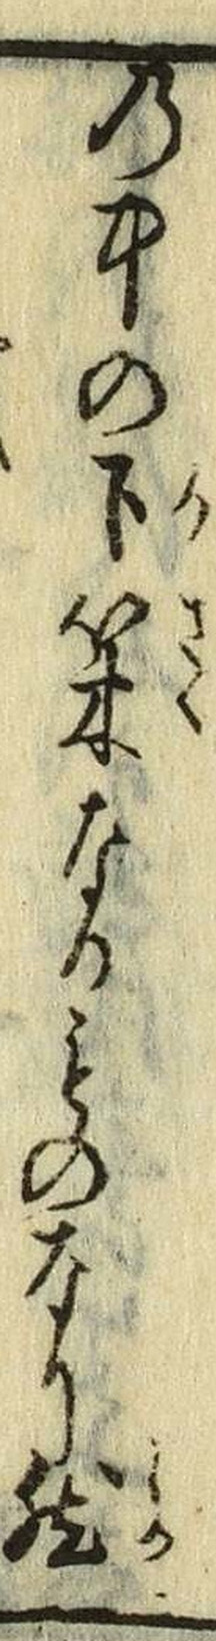の中の下策なるものなり然
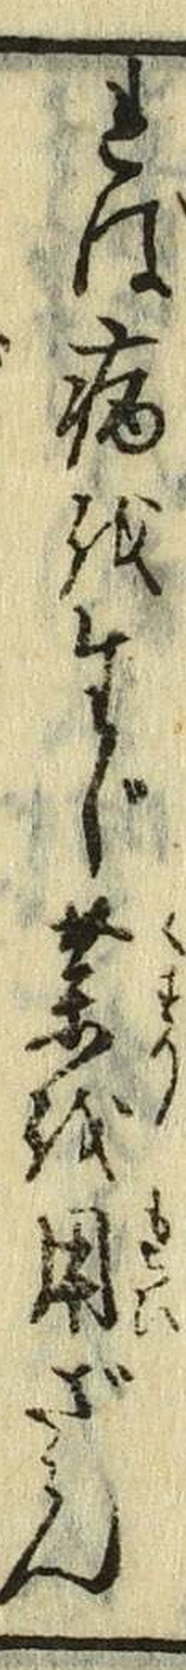れば病生じ薬を用ざらん
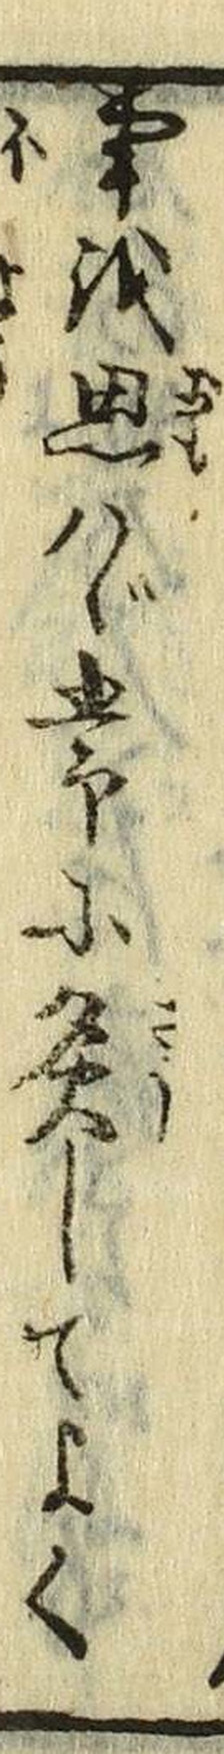事を思はゞ常に灸してよく
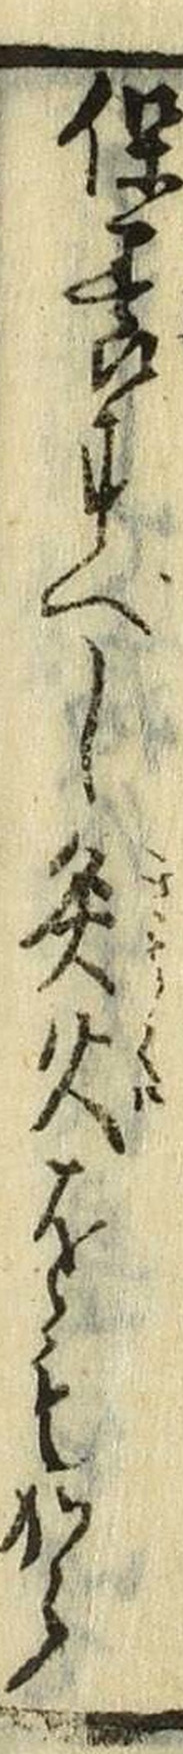保養すべし灸火をもから
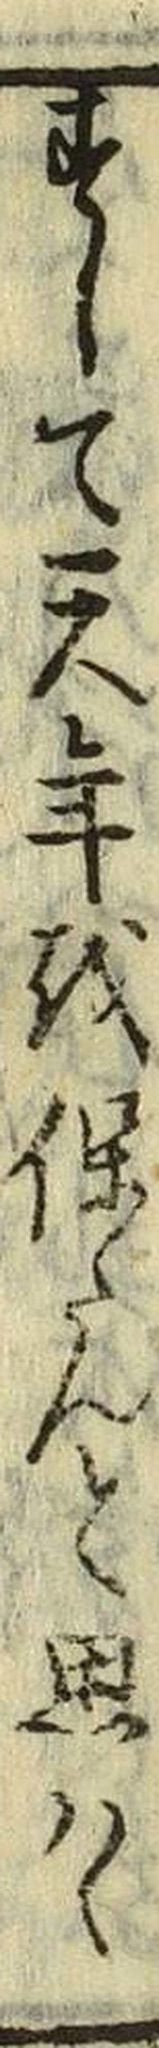すして天年を保たんと思はゝ
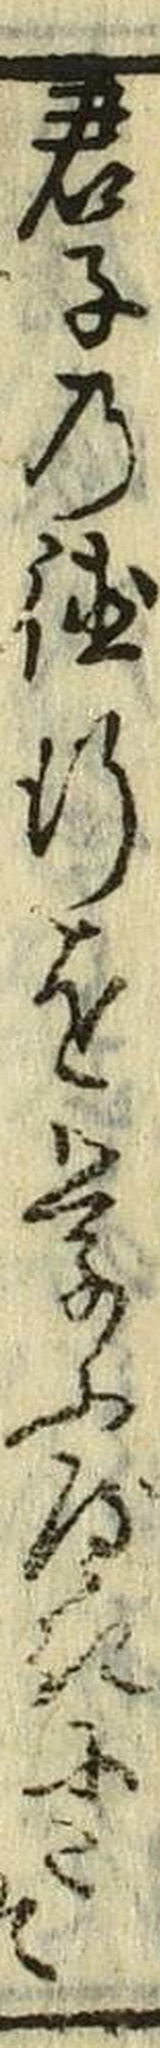君子の徳行を学ふべきにこそ
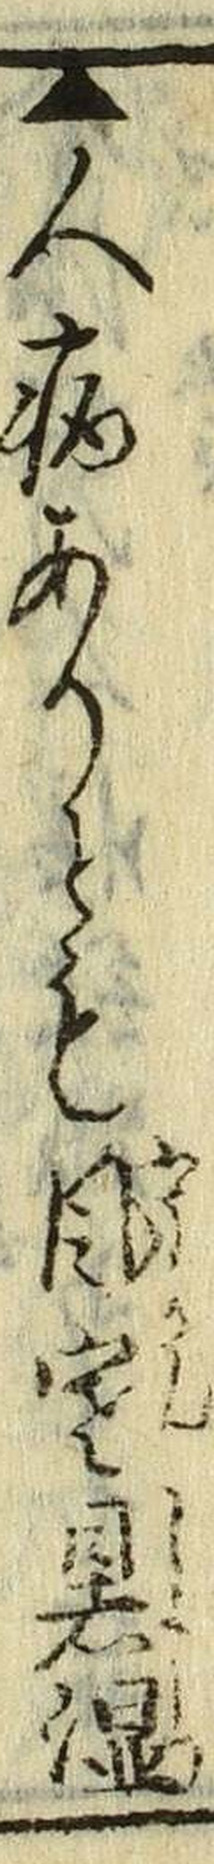▲人病ありとも風寒暑湿
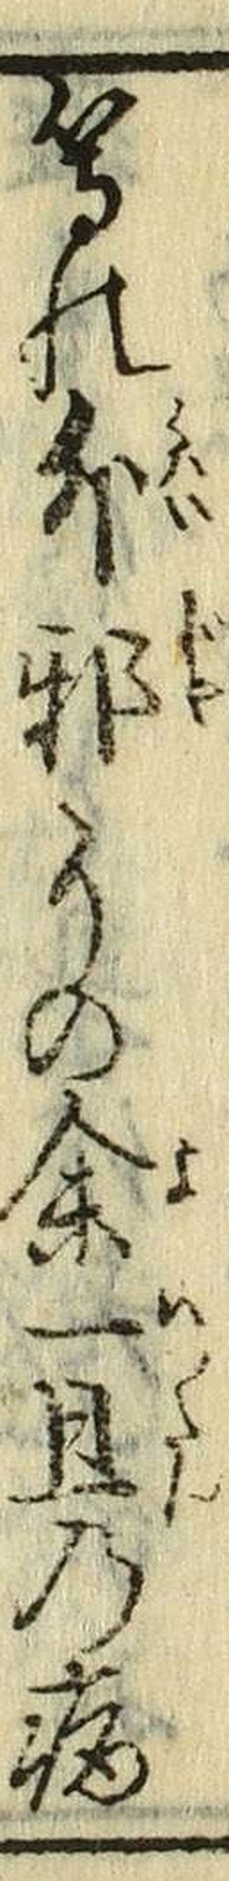等の外邪その余一旦の病
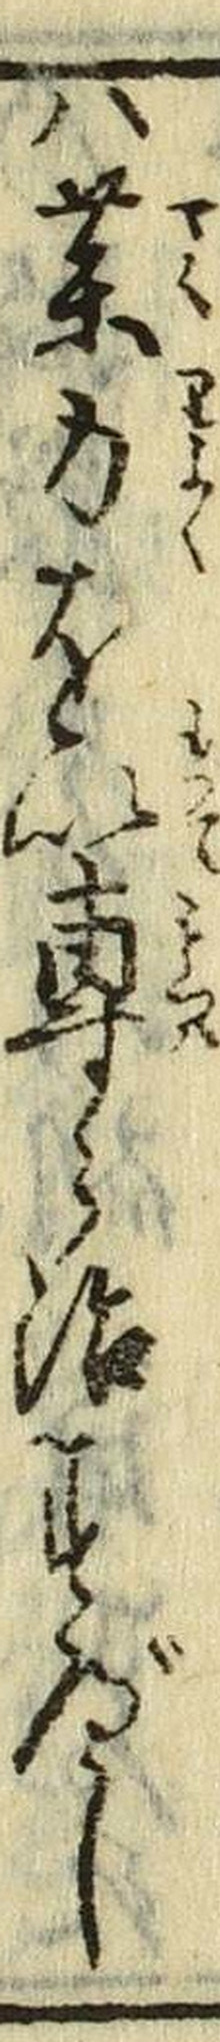は薬力を以専ら治すべし
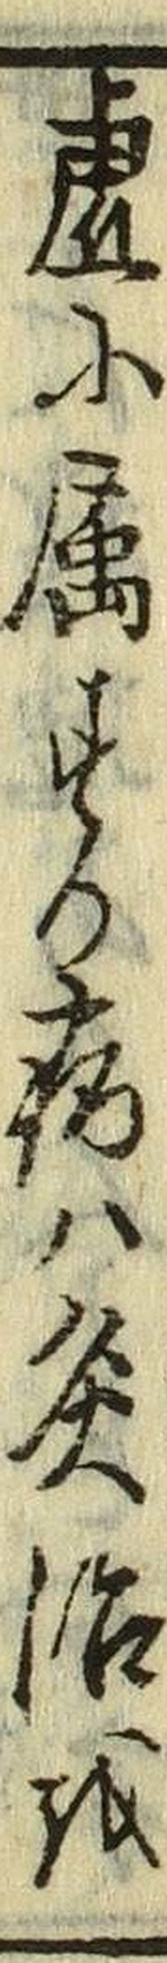虚に属する病は灸治を
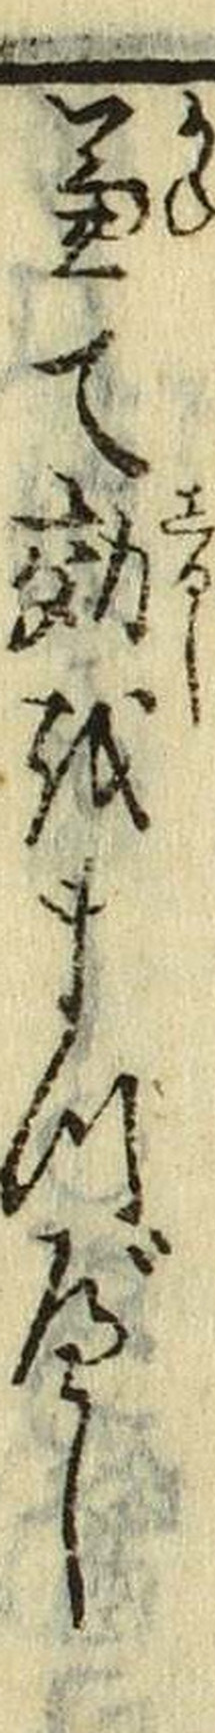兼て効をまつべし
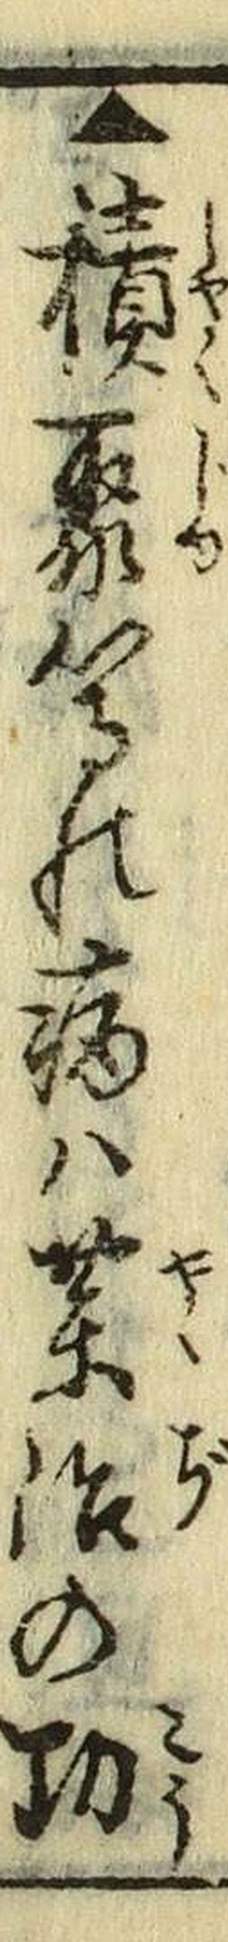▲積聚等の病は薬治の功
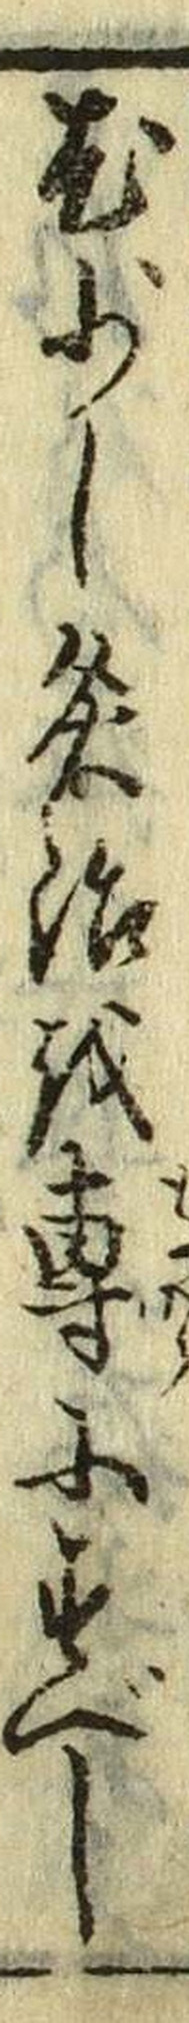尤少し灸治を専にすべし
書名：居家養生記
